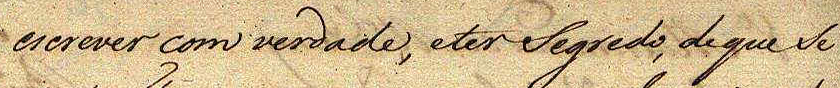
escrever com verdade, e ter Segredo, de que se
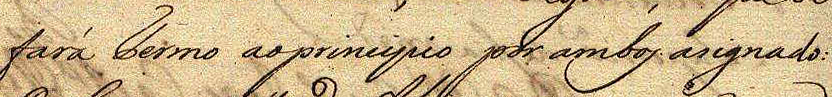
fará Termo ao principio por ambos asignado.
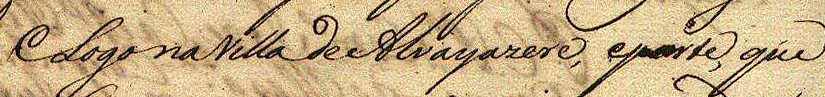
e logo na Villa de Alvayazere, e parte que
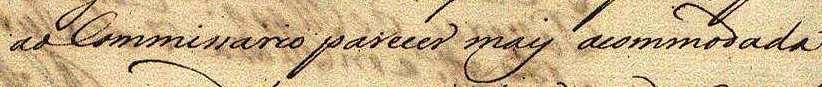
ao Commissario parecer mais acommodada
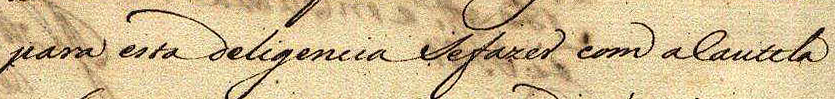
para esta deligencia se fazer com a Cautela
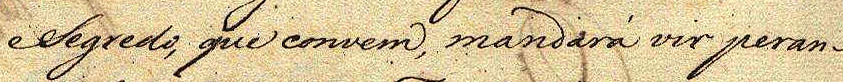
e Segredo, que convem, mandará vir peran
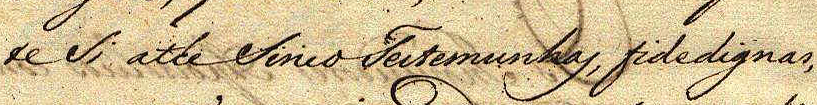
te si athe Sinco Testemunhas, fidedignas,
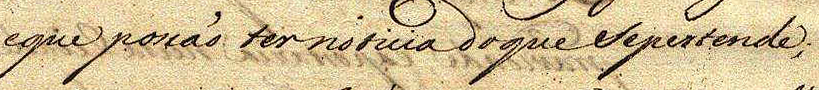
e que possaõ ter notica do que se pertende;
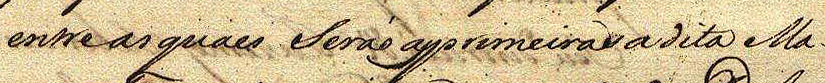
entre as quaes seraõ as primeiras a dita Ma
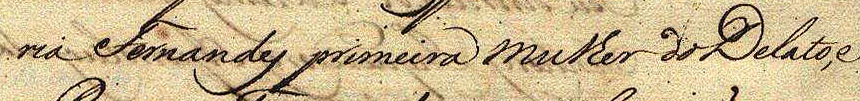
ria Fernandes primeira mulher do Delato, e
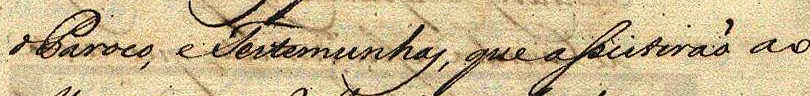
o Paroco, e Testemunhas, que assistiraõ ao
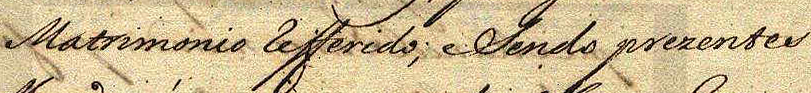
Matrimonio Refferido; e Sendo prezentes
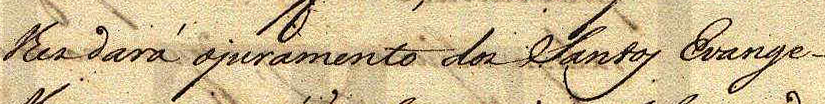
lhes dará o juramento dos Santos Evange
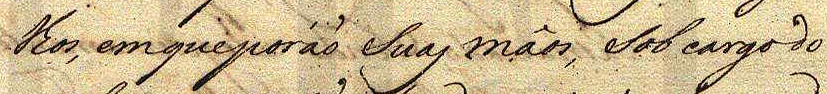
lhos, em que poraõ Suas maõs, sob cargo do
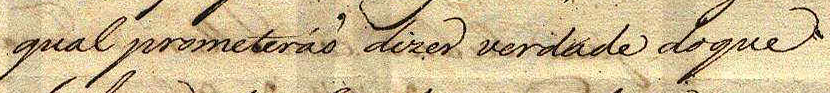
qual prometeraõ dizer verdade do que
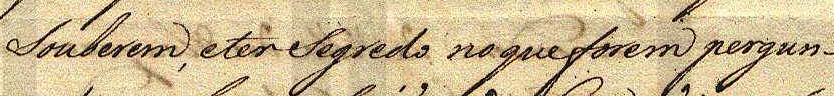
souberem, e ter segredo no que forem pergun
